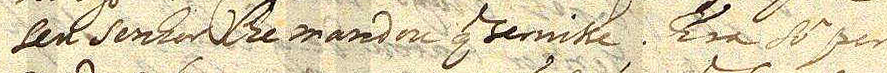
seu senhor lhe mandou q̄ seruisse. Era só per
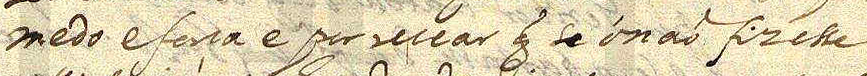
medo e força e por recear q̄ se o naõ fizesse
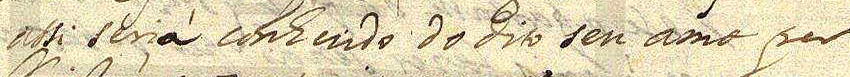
assi seria conhecido do dito seu amo per
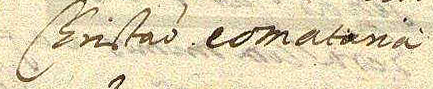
Christaõ e o mataria
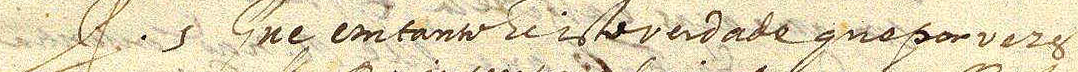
ꝓ. 5 Que em tanto he isto verdade que por vezes
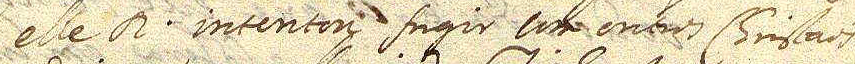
elle R. intentou fugir com outros Christaõs
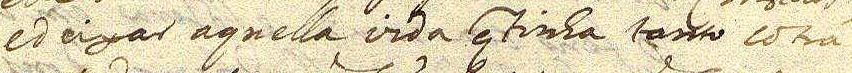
e deixar aquella vida q̄ tinha tanto cōtra
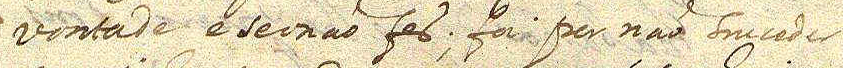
vontade e se o naõ fes; foi per naõ succeder
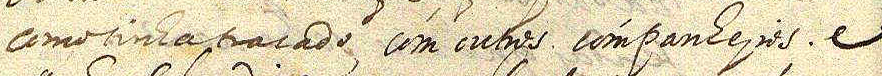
como tinha tracado, com outros companhejros; e
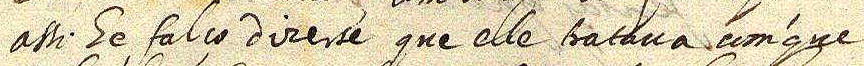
assi he falço dizerse que elle trataua com que
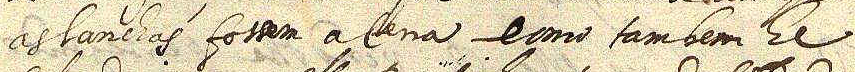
as lanchas fossem a terra como tambem he
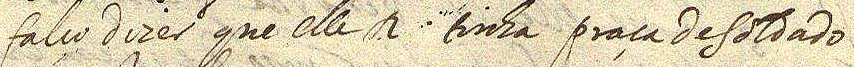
falço dizer que elle R. tinha praça de soldado
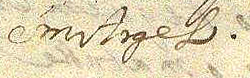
em ArgeL.
